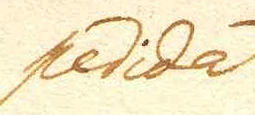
pedida
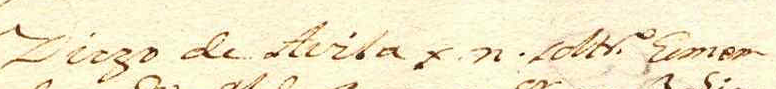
Diogo de Avila x n. soltr.o homem
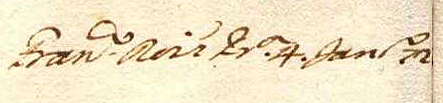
Franco Roiz̄ Pr.a 4. Ianro 72
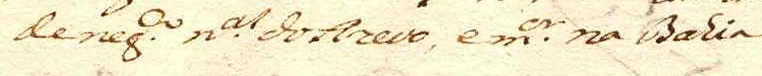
de neg.co n.al do Azevo, e m.or na Bahia
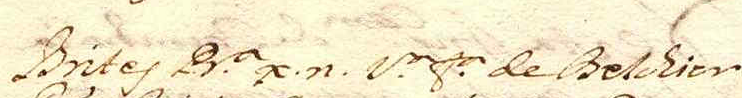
Brites Pr.a x. n. V.a f.a de Belchior
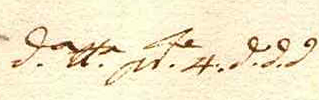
d.a tt.a pr.te 4. d̄. d̄. d̄
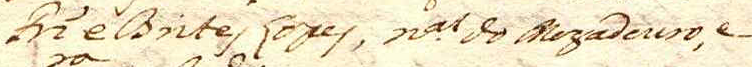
Frz̄ e Brites Lopes, na.l do Mogadouro, e
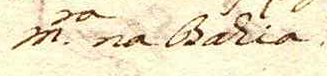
m.ra na Bahia.
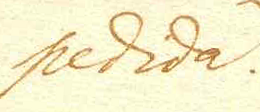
pedida.
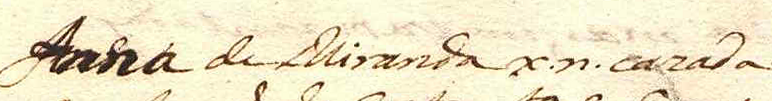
Anna de Miranda x. n. cazada
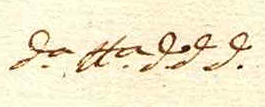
d.a tt.a d.o d.o d.o
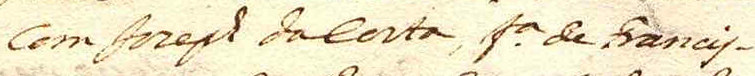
com Jozeph da Costa, f.a de Francis
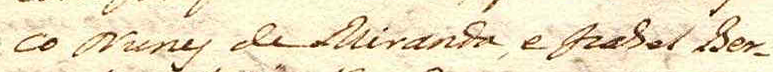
co Nunes de Miranda, e Jzabel Ber
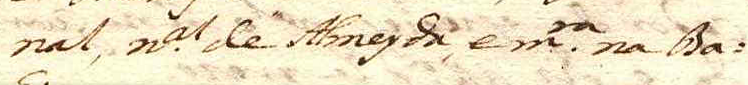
nal, n.al de Almeyda, e m.ra na Ba
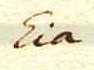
hia
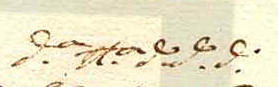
d.a tt.a d.o d.o d.o
